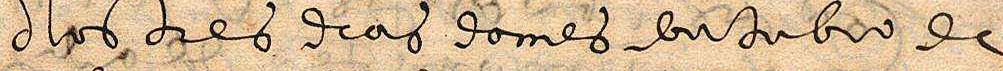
Aos tres dias do mes doutubro de
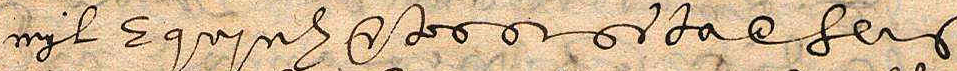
miL E qujnhe̅tos sese̅ta e seis
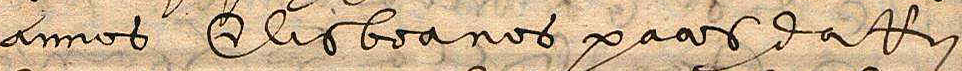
annos e̅ lisboa nos paços da Ry
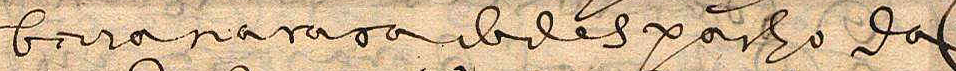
beira na casa do despacho da
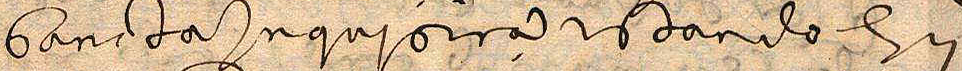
sancta Jnqujsiça̅ estando hy
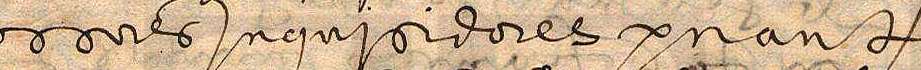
os sore̅s Jnqujsidores perante
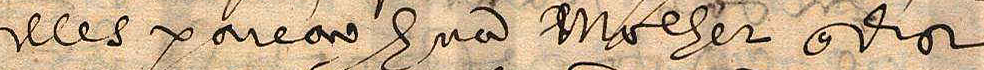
elles pareçeo hua̅ molher q̅ dise
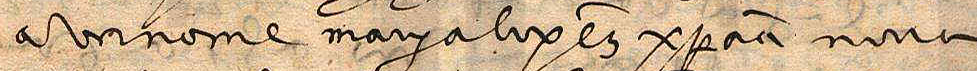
aver nome marya lope̅z xpa̅a noua
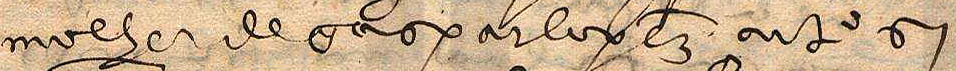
molher de gaspar lope̅z outo sy
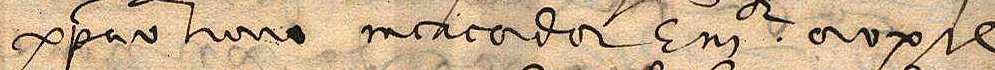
xpão nouo mercador E mor. ao pre
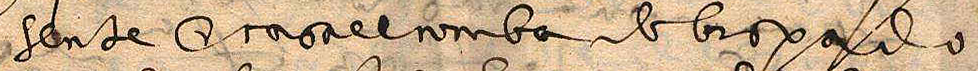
sente e̅ casall comba do bispado
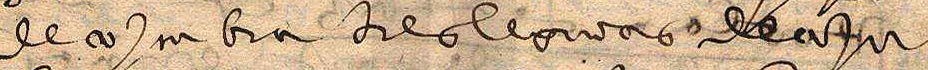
de cojmbra tres leguoas de cojm
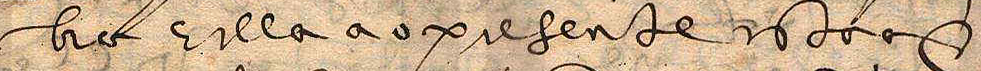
bra E ella ao presente estaa e̅
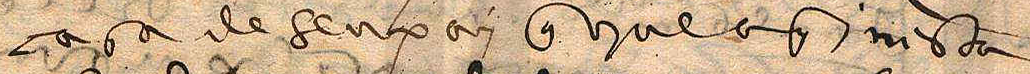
casa de seu pay q̅ vjue aq̅j nesta
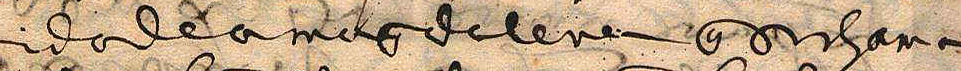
cidade a magdelena q̅ se chama
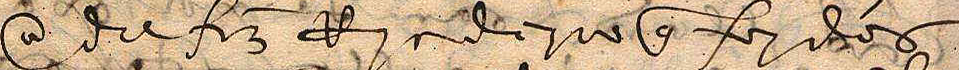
a̅dre frz̅ Rjndejro q̅ foj dos
